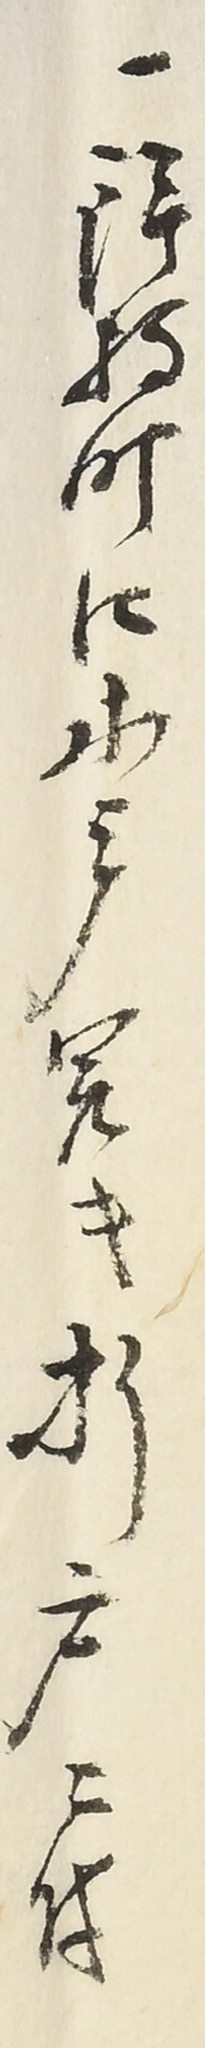一鉾持町口木戸開キ折戸ニ付
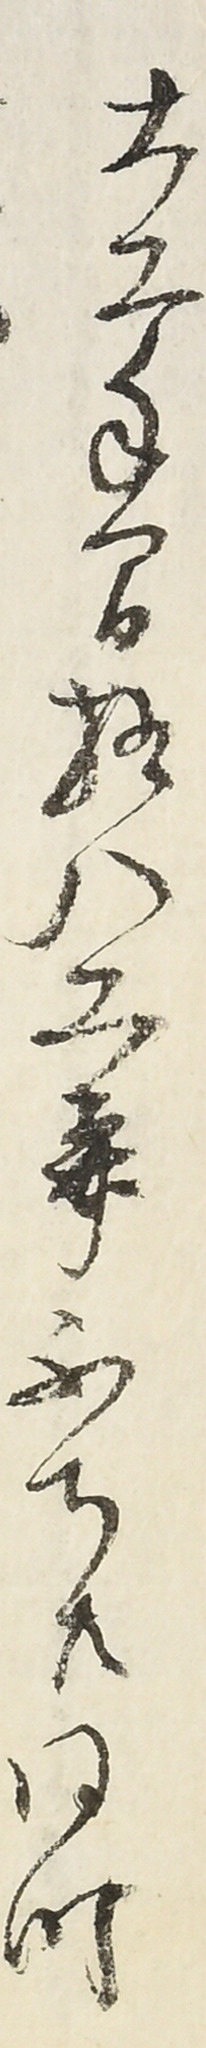大工手間拾八工并ふち共同町
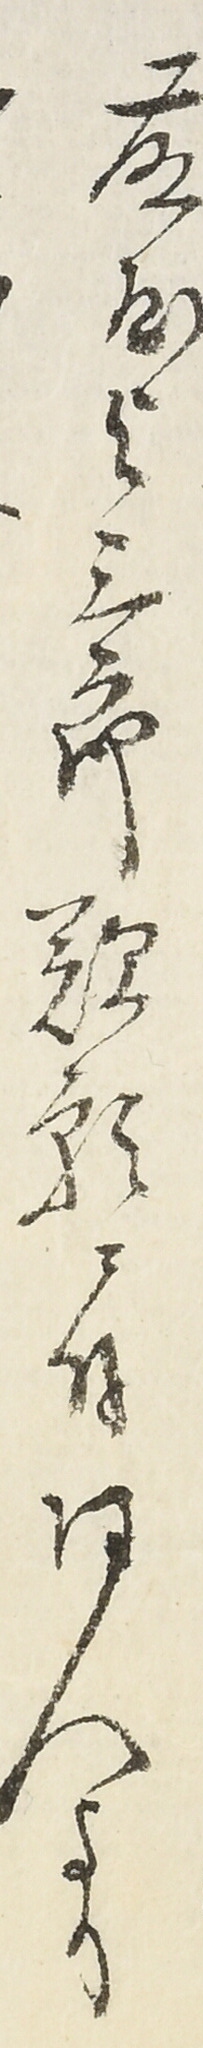藤屋与三郎歎願ニ付同人より
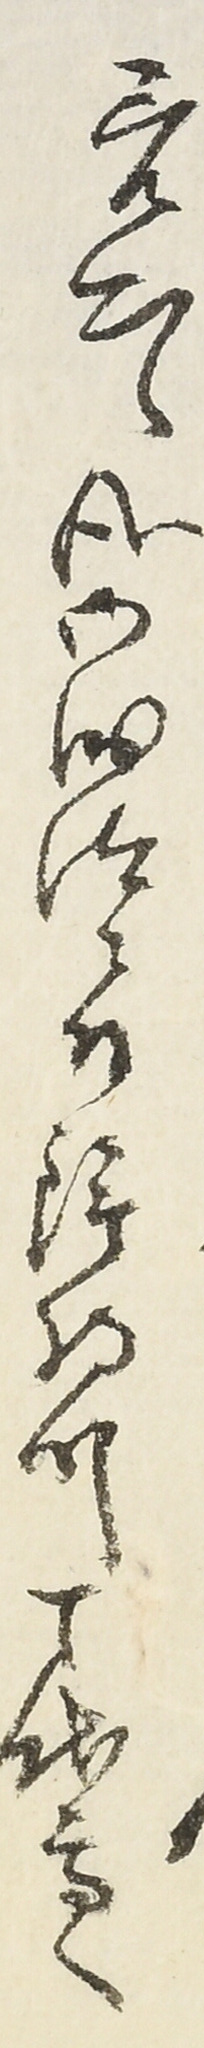差出候様御沙汰ニ付鉾持町丁代方へ
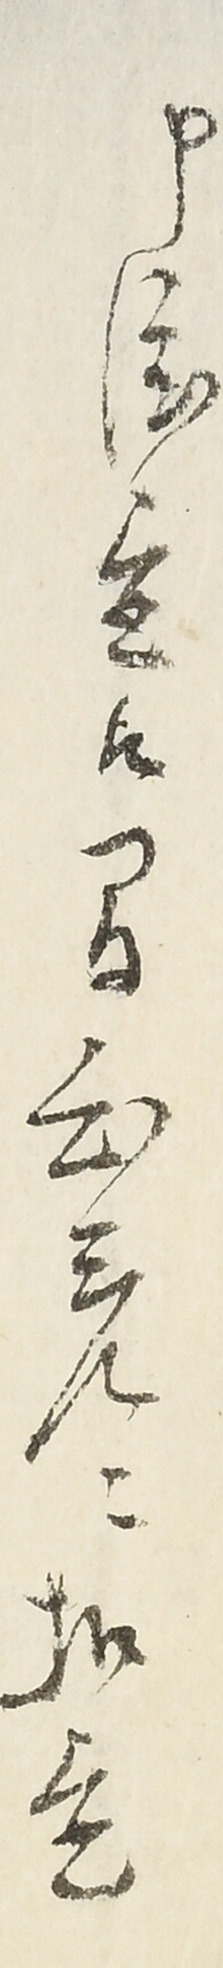申渡置候間心覚ニ控置
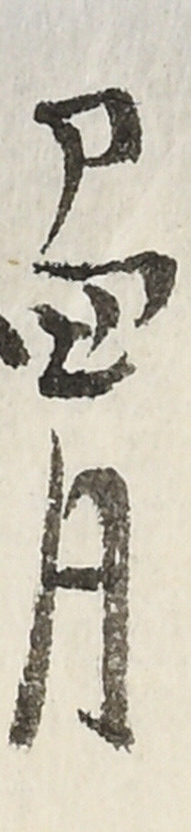申四月
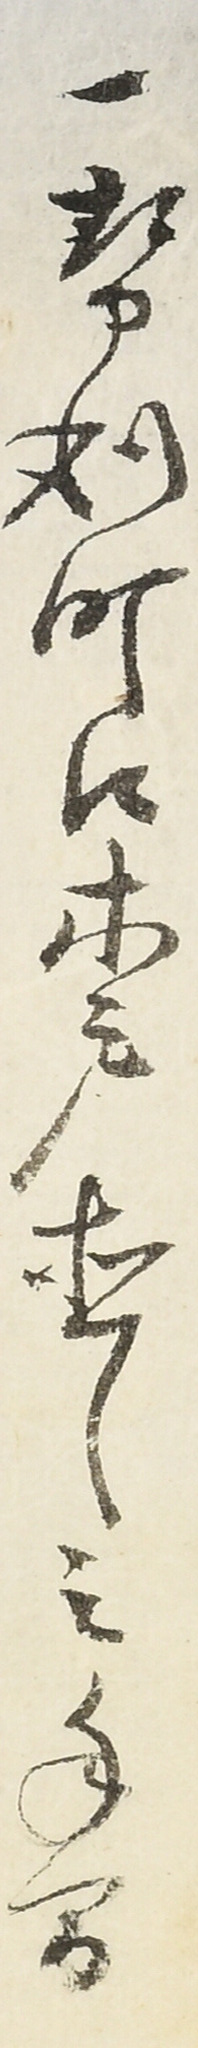一勢利町口木戸直し之手間
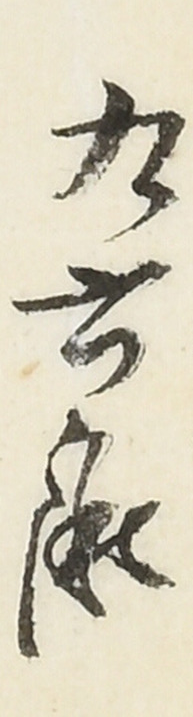九六鍬
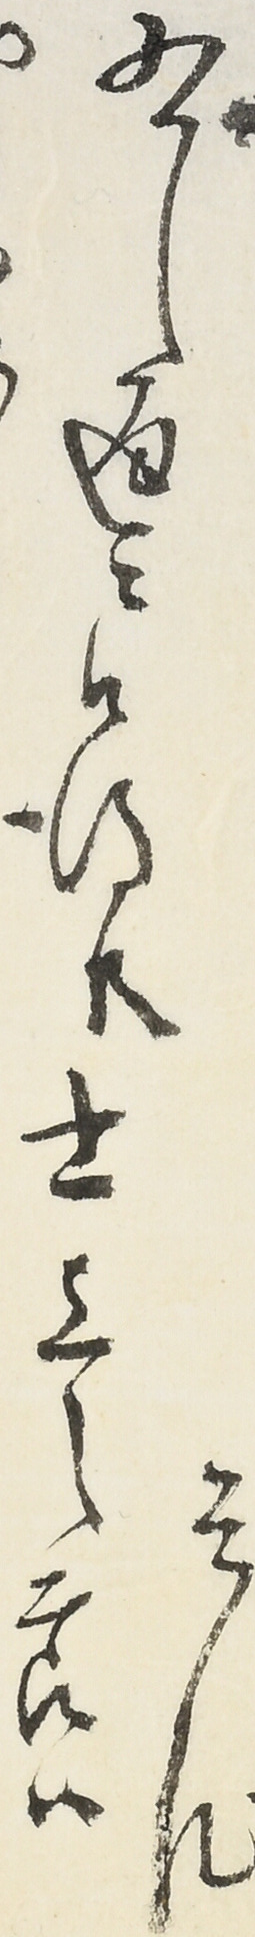右之通ニ候得共書上之節ハ
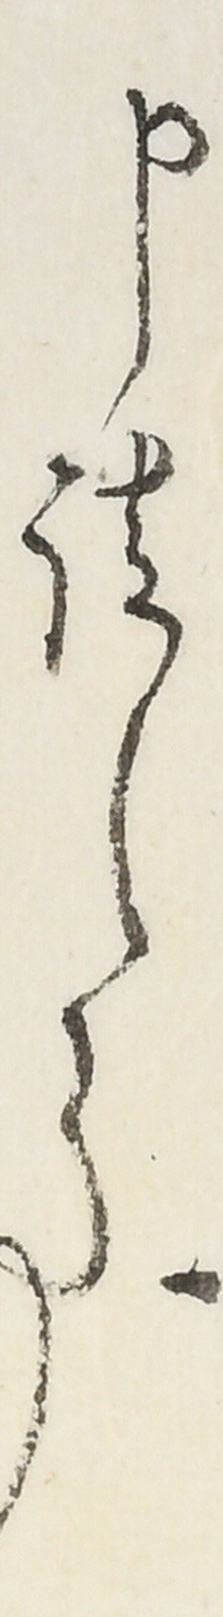申談之事

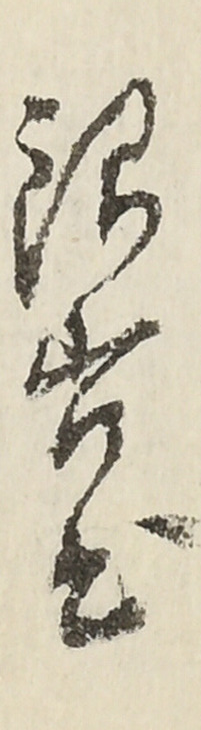銀杏屋
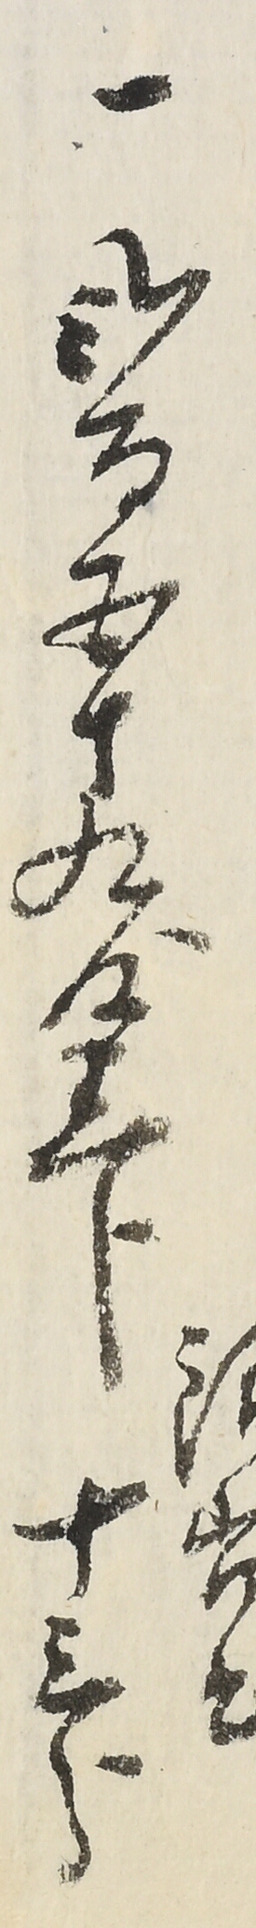一弐百五十九匁三分十三郎
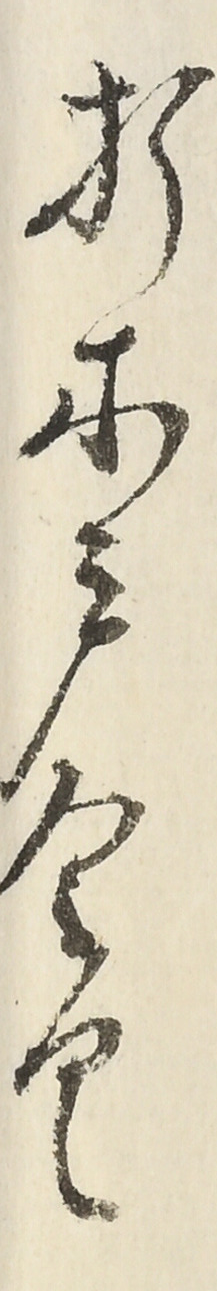杉木戸金具
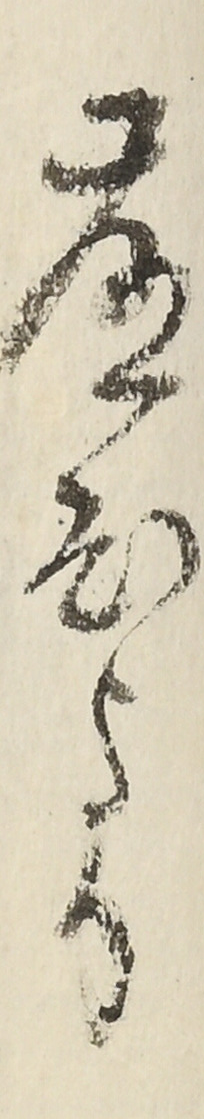藤屋より
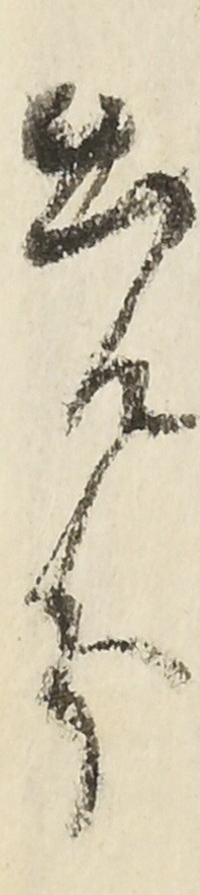出ル分
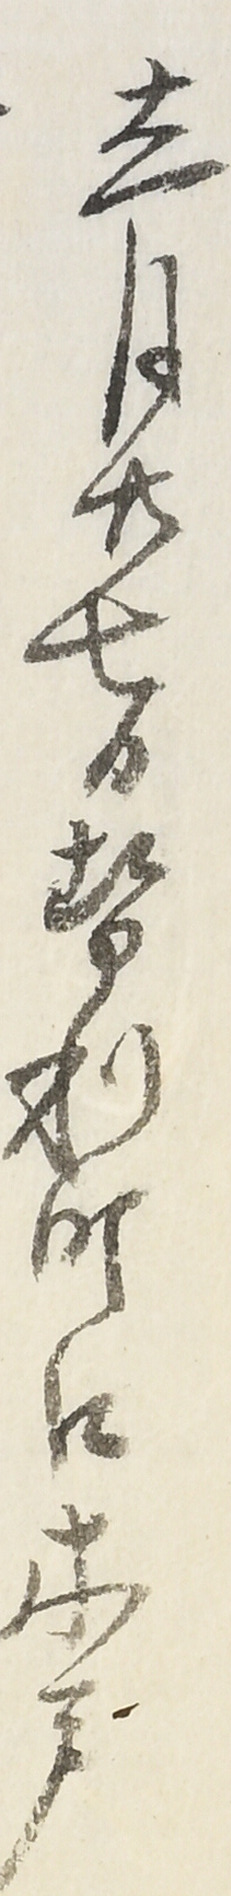去月廿七日勢利町口木戸
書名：町方木戸御普請諸事附（一括）
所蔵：伊那市立高遠町図書館・合同会社AMANE
